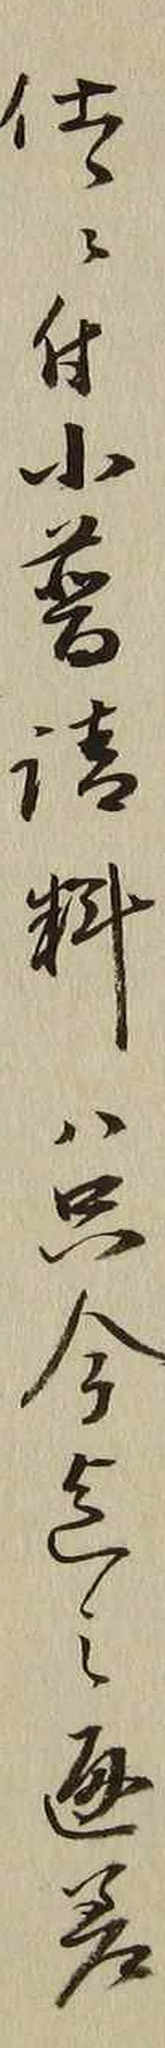仕候ニ付小普請料ハ只今迄之通差
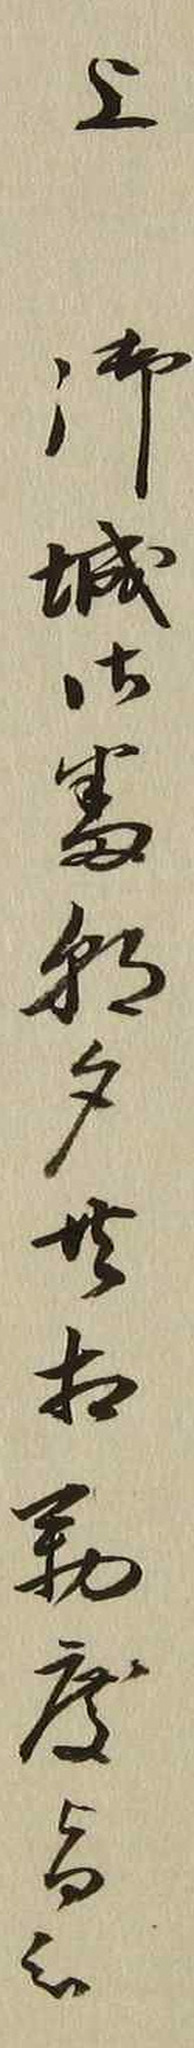上御城御番朝夕共相勤度旨被
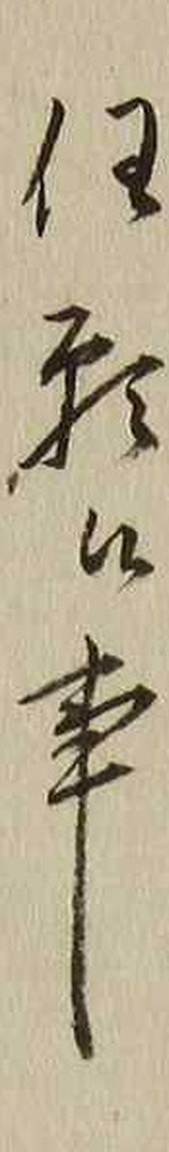任願候事
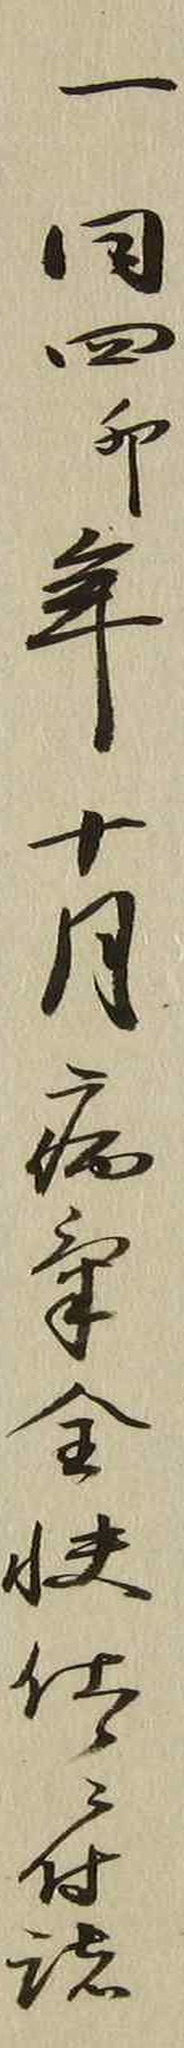一同四卯年十月病気全快仕候ニ付諸
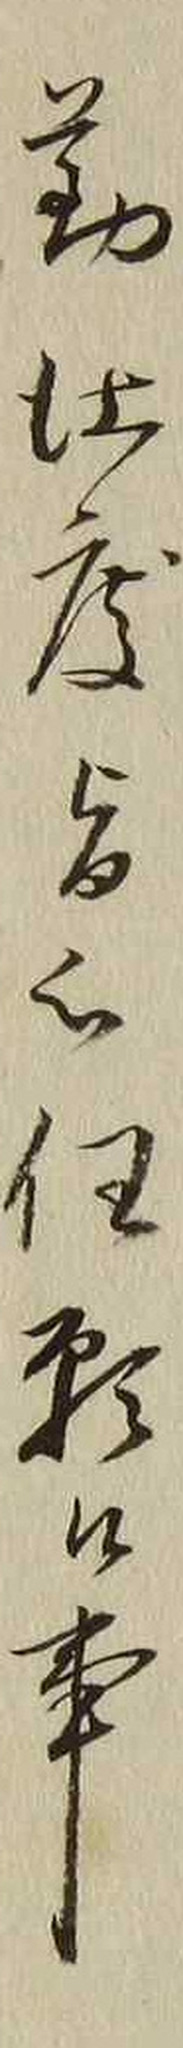勤仕度旨被任願候事
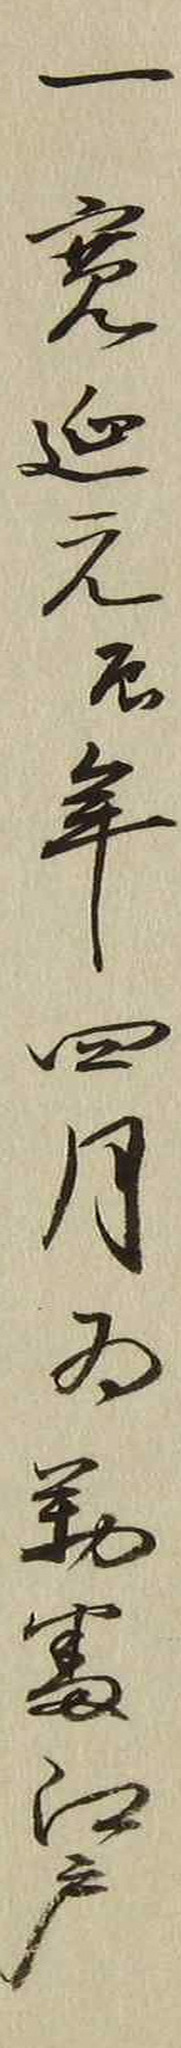一寛延元辰年四月為勤番江戸
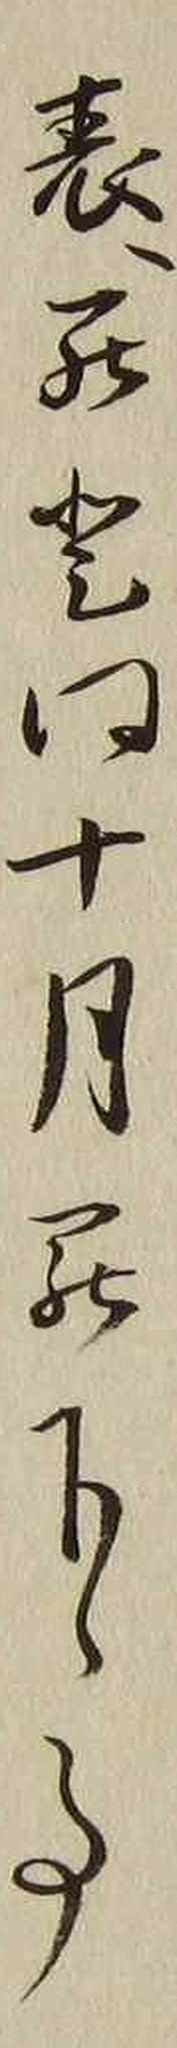表へ罷登同十月罷下候事
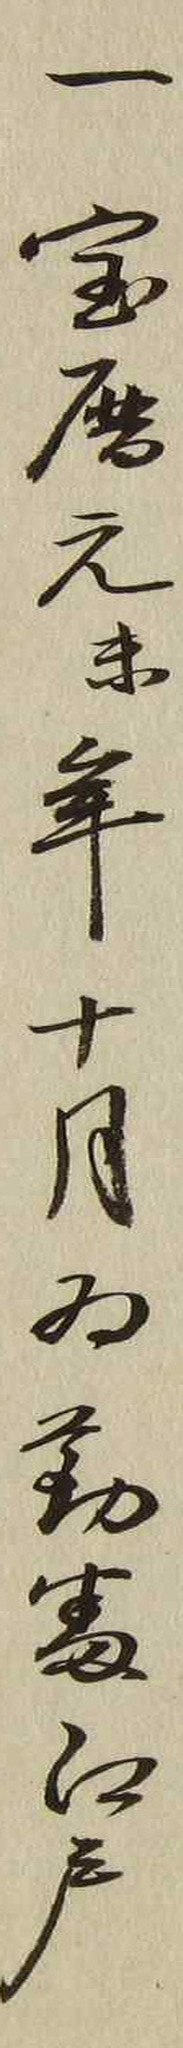一宝暦元未年十月為勤番江戸
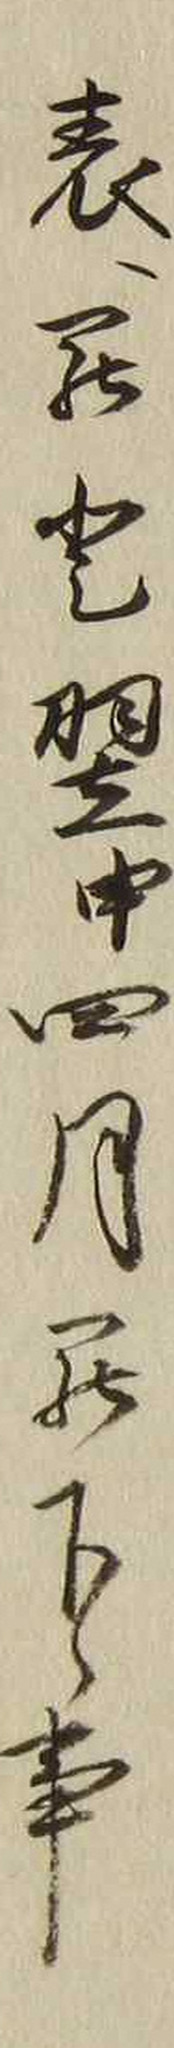表へ罷登翌申四月罷下候事
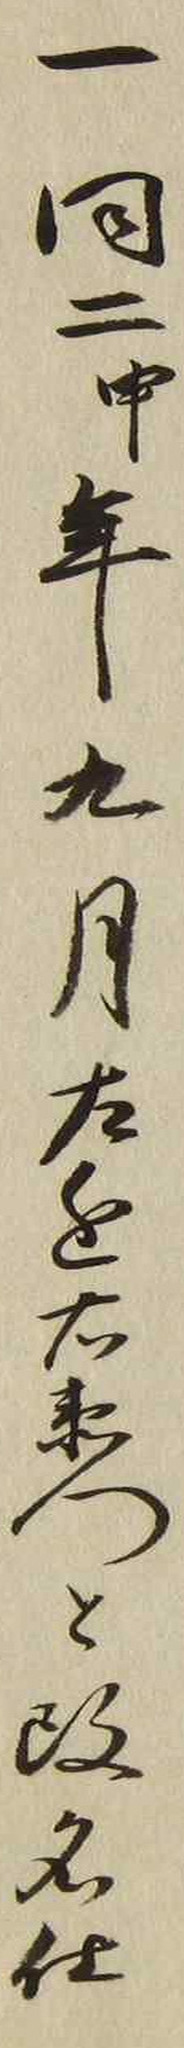一同二申年九月左近右衛門と改名仕
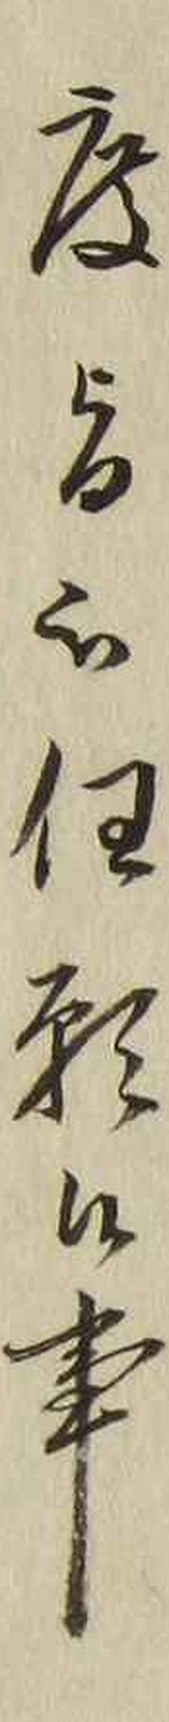度旨被任願候事

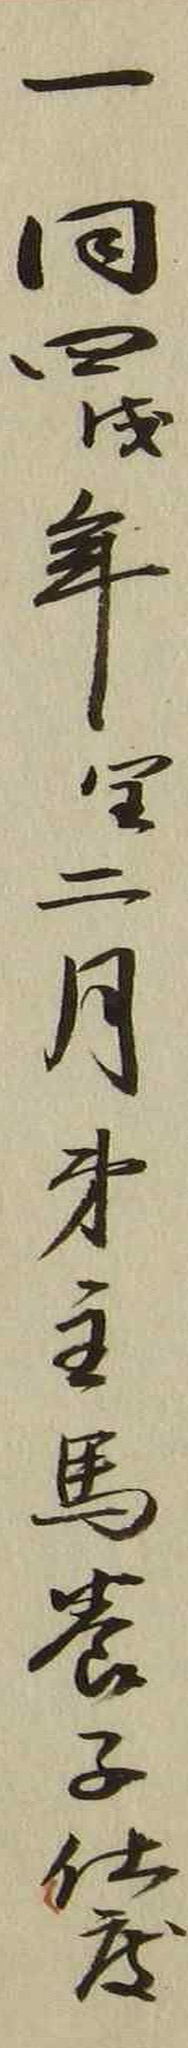一同四戌年閏二月弟主馬養子仕度
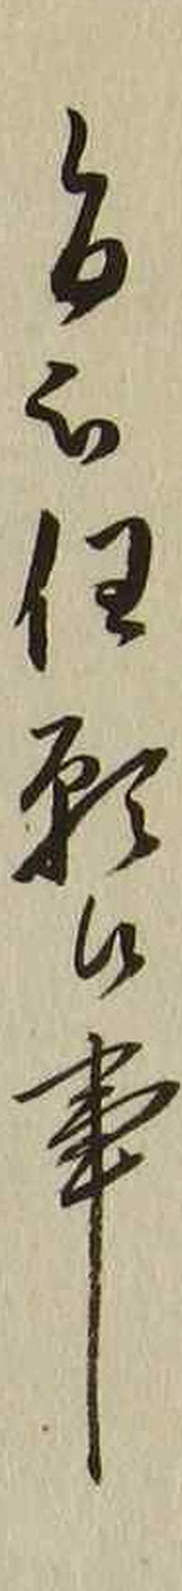旨被任願候事
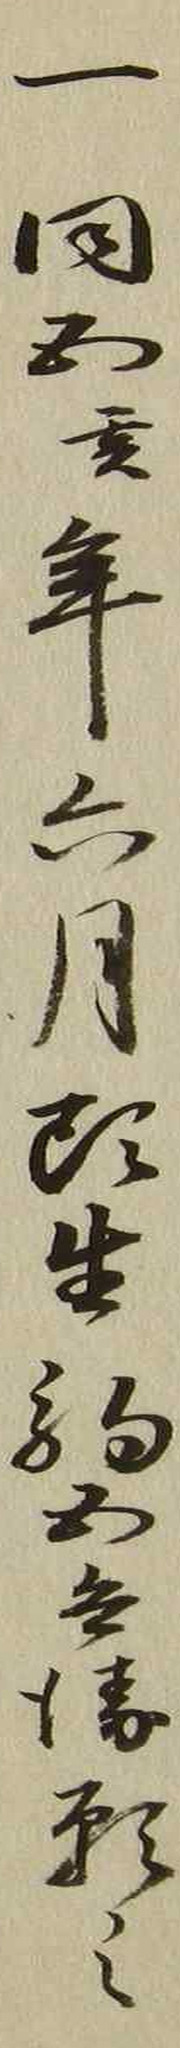一同五亥年六月頭生駒五兵衛願之
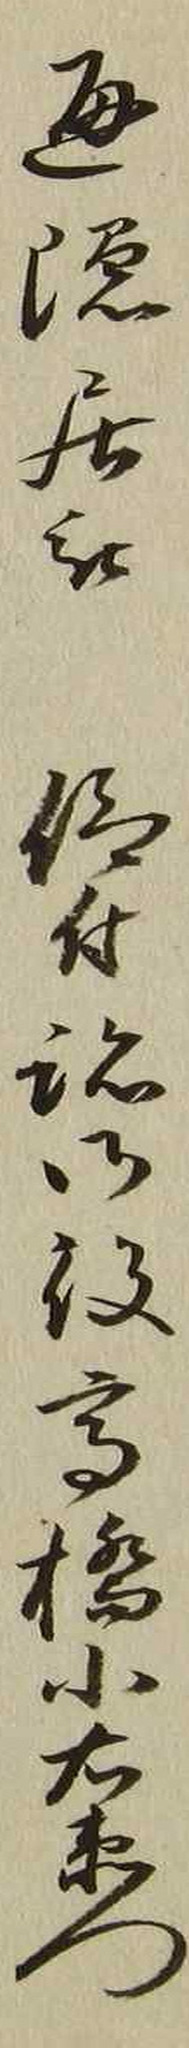通隠居被仰付跡御役高橋小右衛門
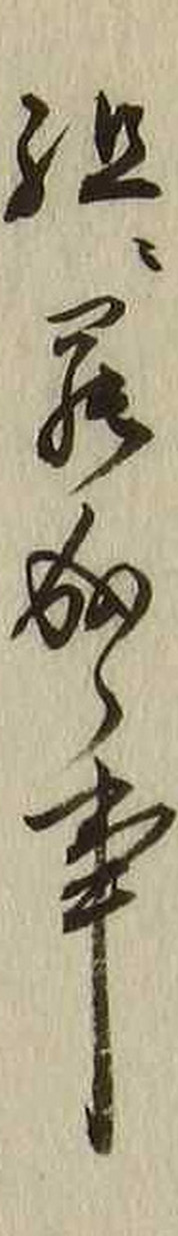組ニ罷成候事
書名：諸士系譜　巻之69　を之部3
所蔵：会津若松市立会津図書館
